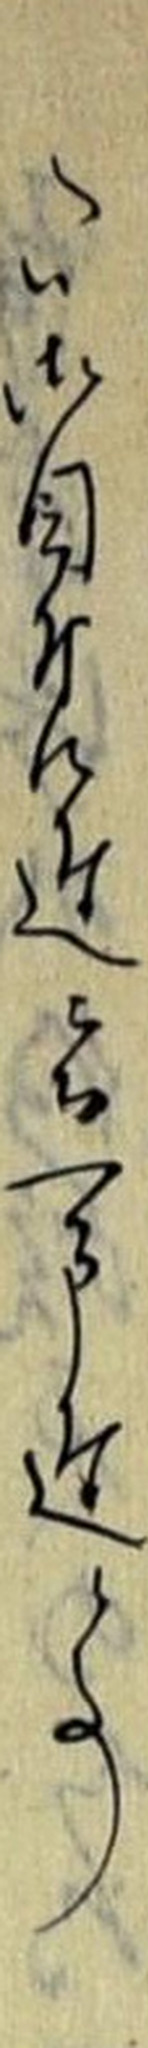ヘハ御目付口達ニ而可申達候事
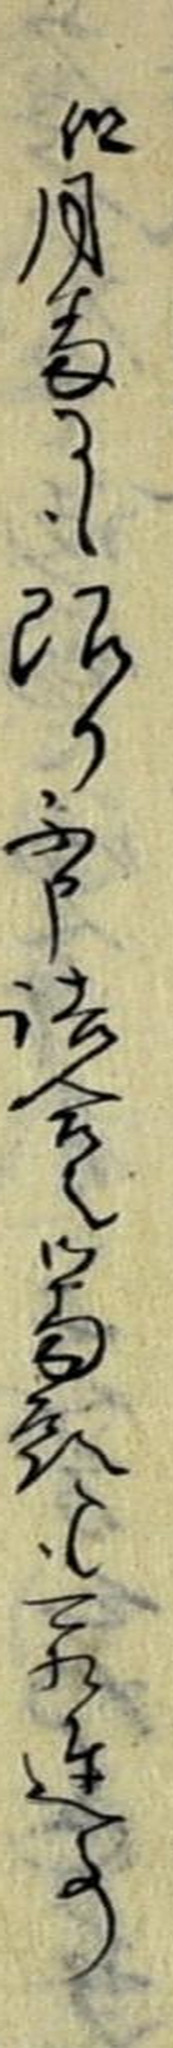但月番にも限り不申詰合之御番頭へも可相達事
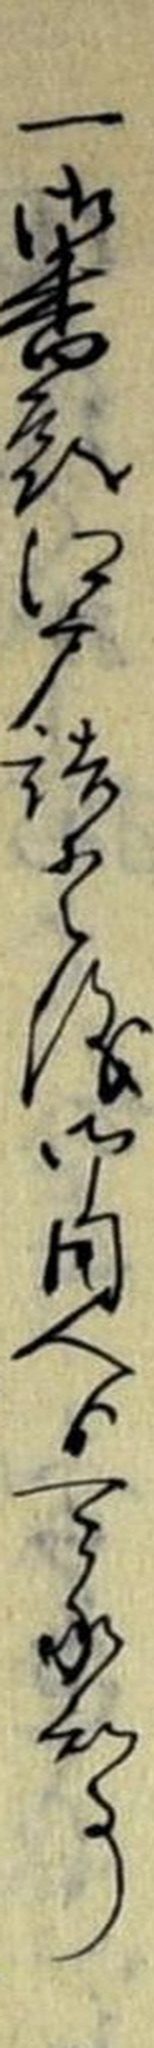一御番頭江戸詰等之儀御用人ゟ可承知事
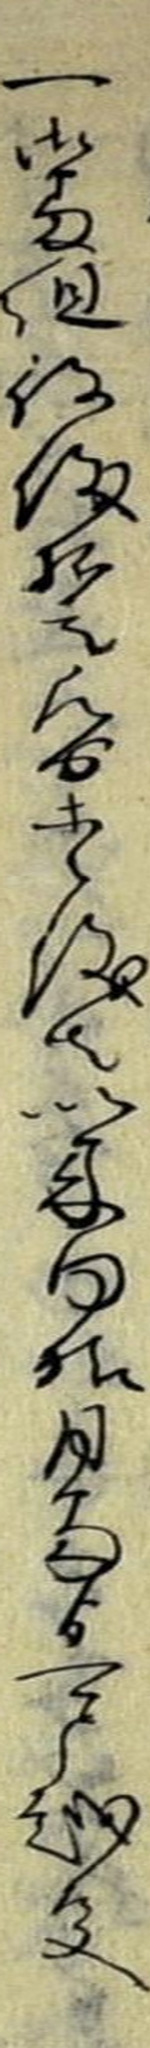一御番組役儀誓紙等之儀者以来同様月番ゟ可申越事
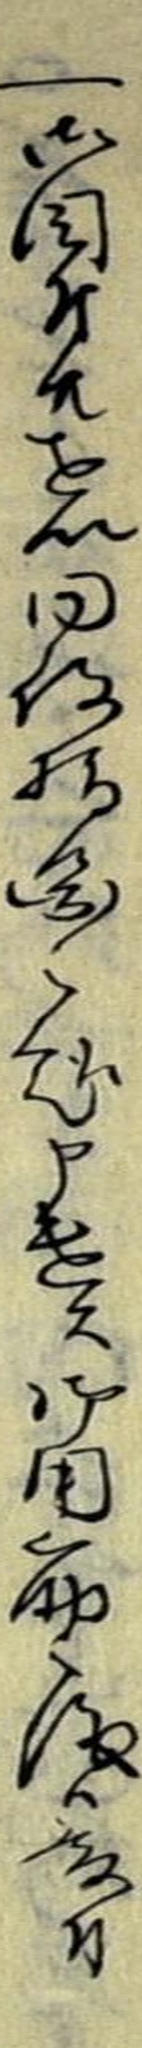一御目付共を以同役指図之趣申遣ス御用筋之儀ハ殿付
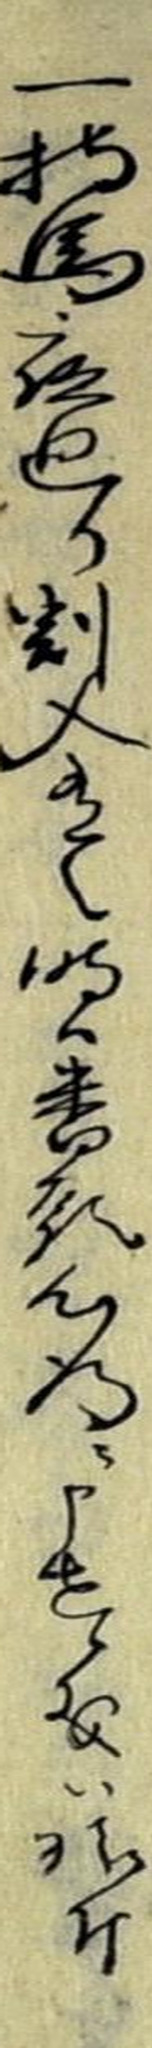一持馬夜廻り割入有之時ハ番頭心得ニ申遣候義ハ様付
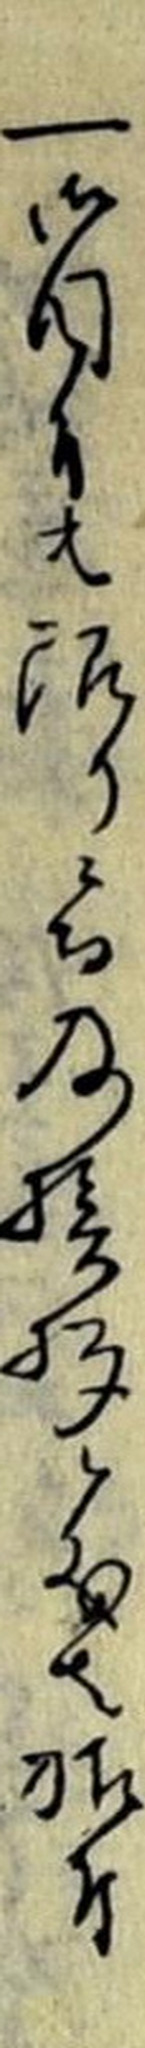一御目付共限りニ而及挨拶候義者様付
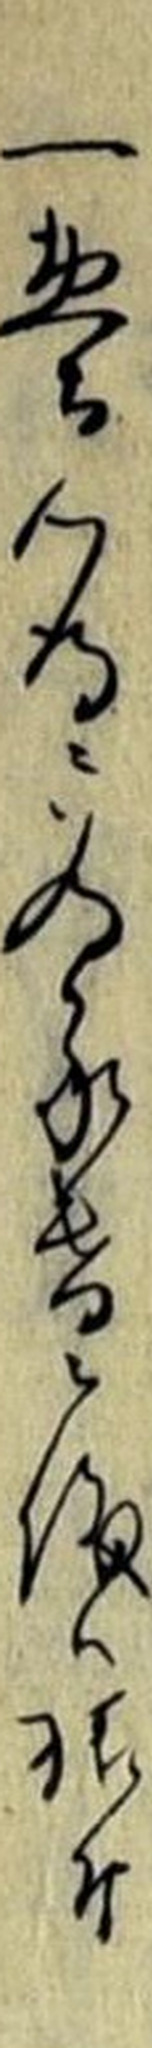一惣而心得ニ為承替候儀ハ様付
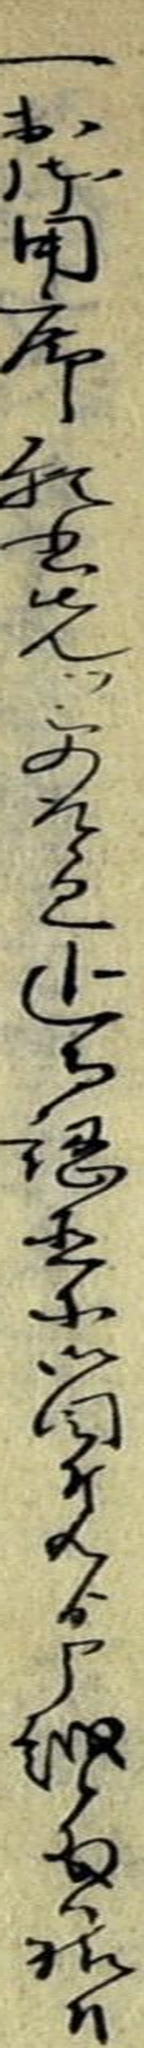一於御用席願書先ツ受取已追而認直等御目付共ゟ申越候義ハ様付
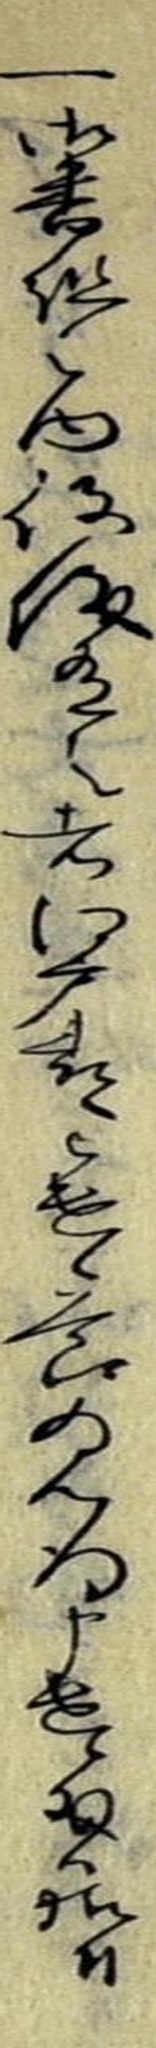一御番組之内役儀有之者江戸表へ被遣候節為心得申遣候義ハ様付
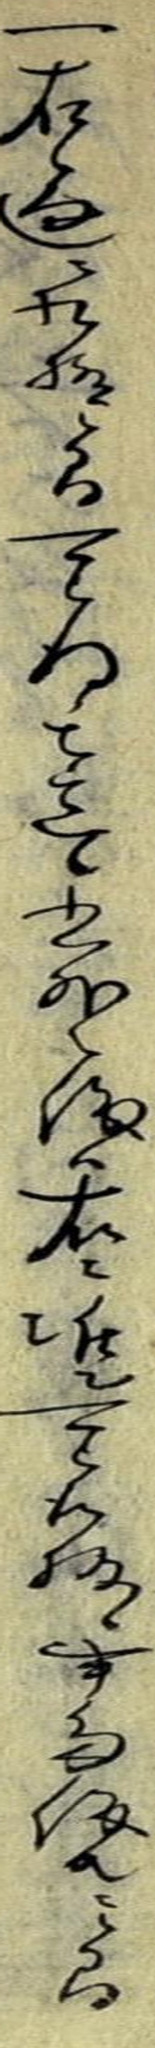一右之通ニ相極候間可被得其意候書外之儀ハ右ニ准シ可被取扱候事多儀共ニ候間
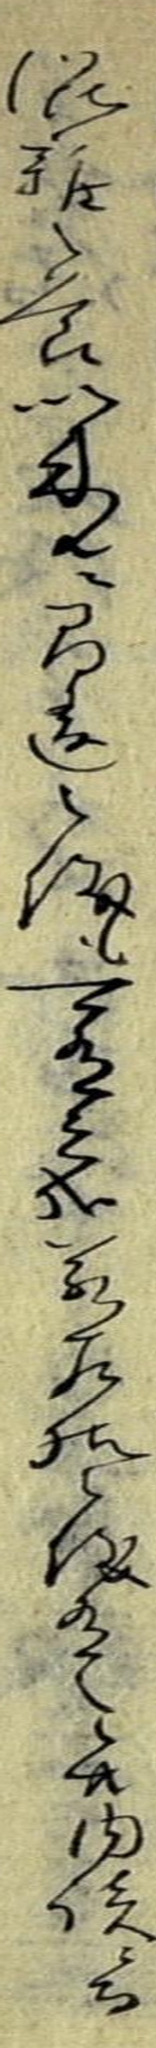混雑之節以来ルニ間違之儀も可有之哉若左様之儀有之候共内談ニ而
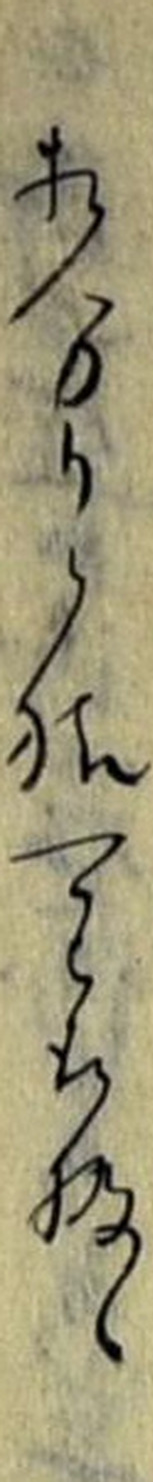相分り候様可被取扱候
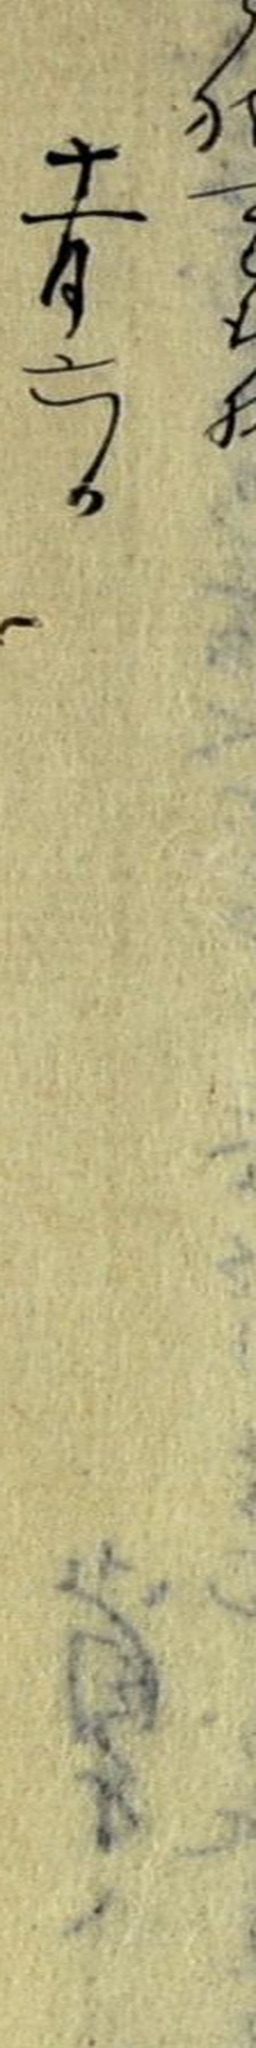十一月六日
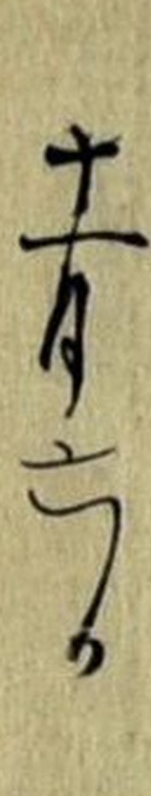十一月六日

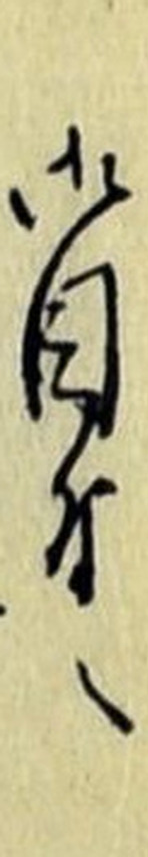御目付へ
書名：命令之部 三
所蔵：福井県文書館 Fukui Prefectural Archives
